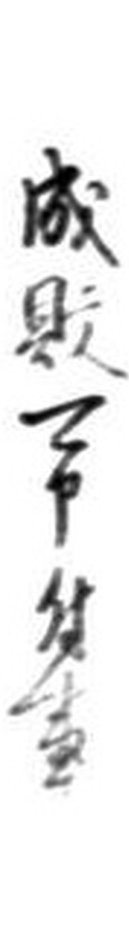成敗可申付事
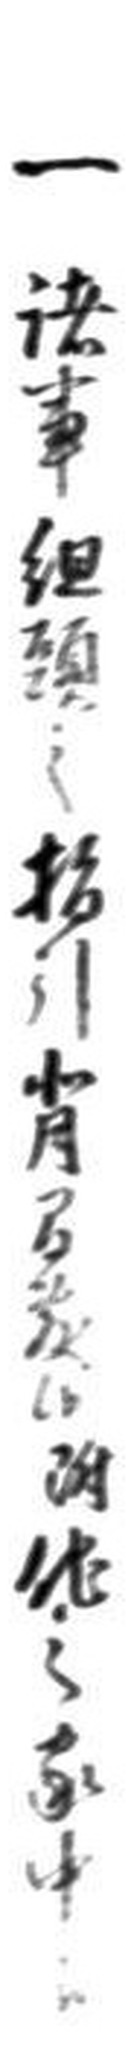一諸事組頭之指引背間敷候附他之家中江
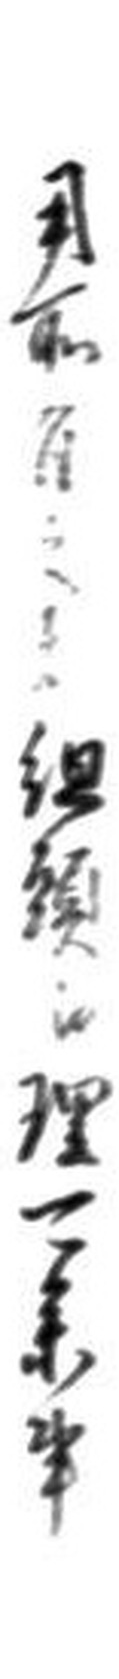用所有之而ハ組頭江理可参事
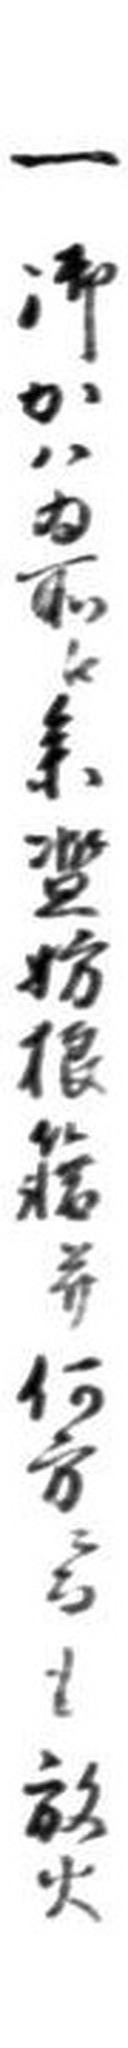一御かハゐ所？江参濫妨狼籍并何方ニ而も放火
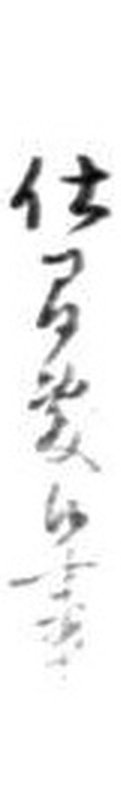仕間敷候事
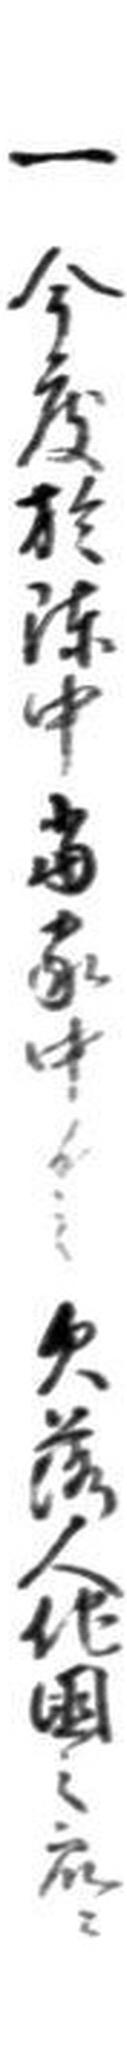一今度於陣中当家中ゟ之欠落人他国之衆ニ
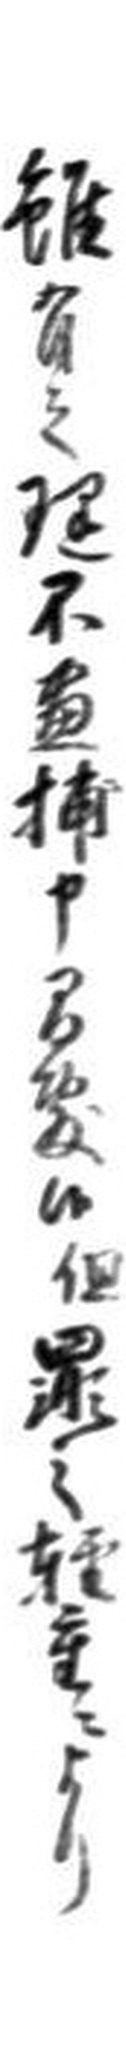雖有之理不尽捕申間敷候但罪之軽重ニより

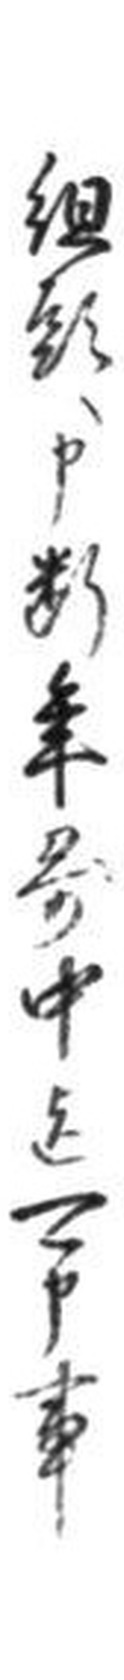組頭へ申断年寄中迄可申事
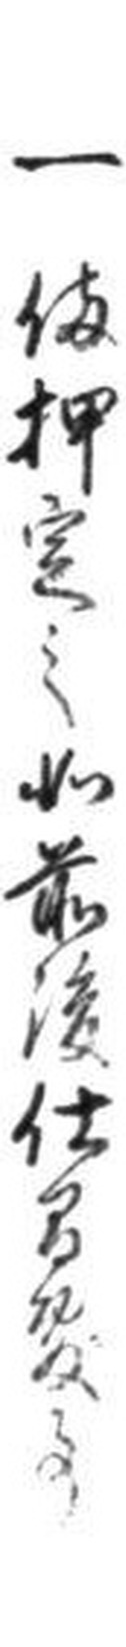一備押定之如前後仕間敷事
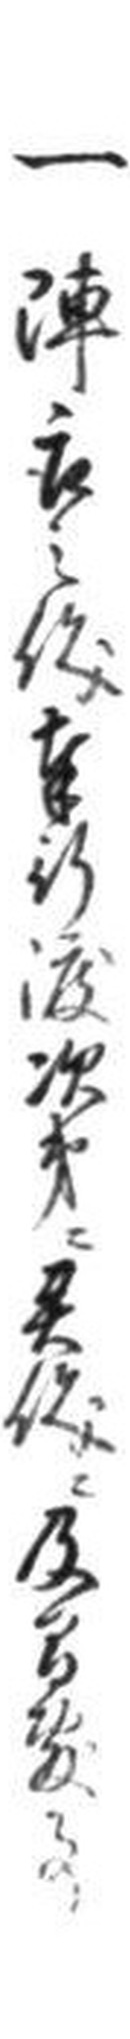一陣取之儀奉行渡次第ニ異儀ニ及間敷事
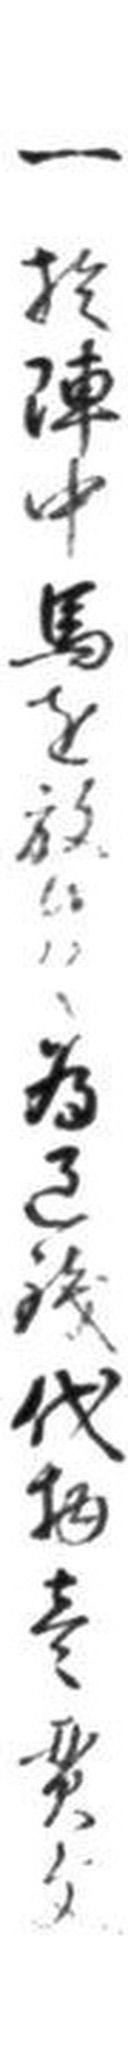一於陣中馬を放候ハヽ為過銭代物壱貫文
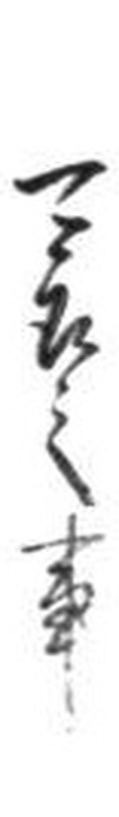可取之事
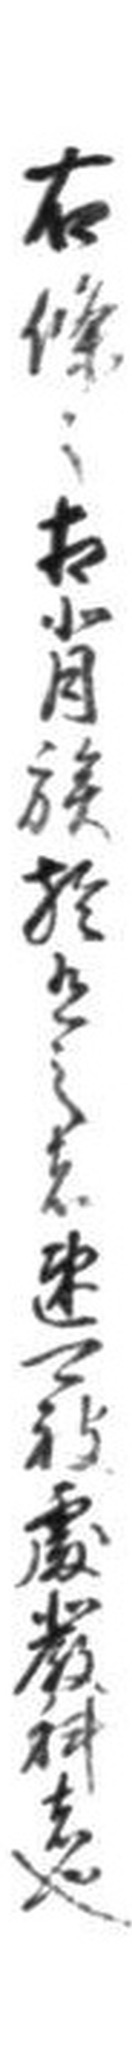右條々相背族於有之者速可被処厳科者也
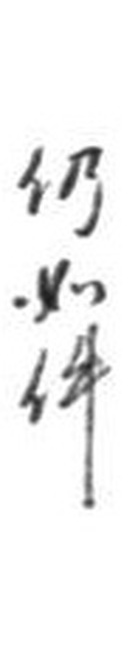仍如件
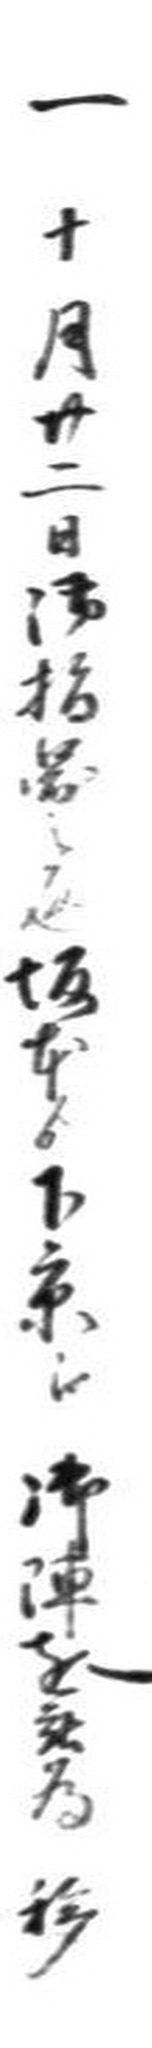一十月廿二日御指図之通坂本ゟ下京江御陣を被為移
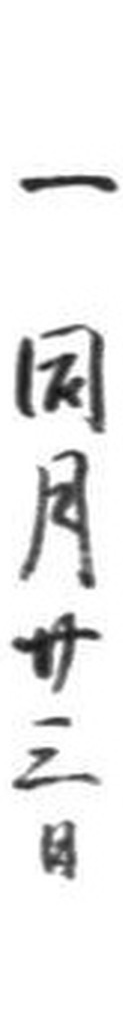一同月廿三日
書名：家譜 二 忠直公 従文禄四年到慶安四年
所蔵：福井県文書館 Fukui Prefectural Archives
